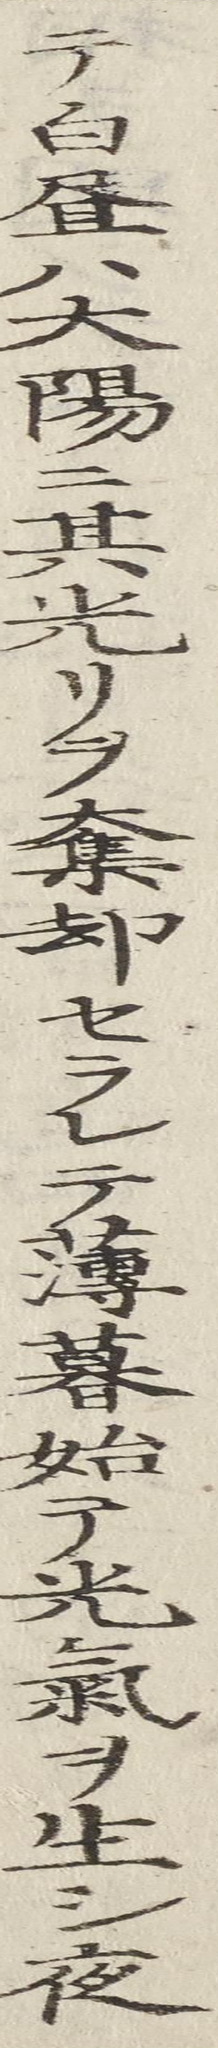テ白昼ハ大陽ニ其光リヲ奪却セラレテ薄暮始テ光気ヲ生シ夜
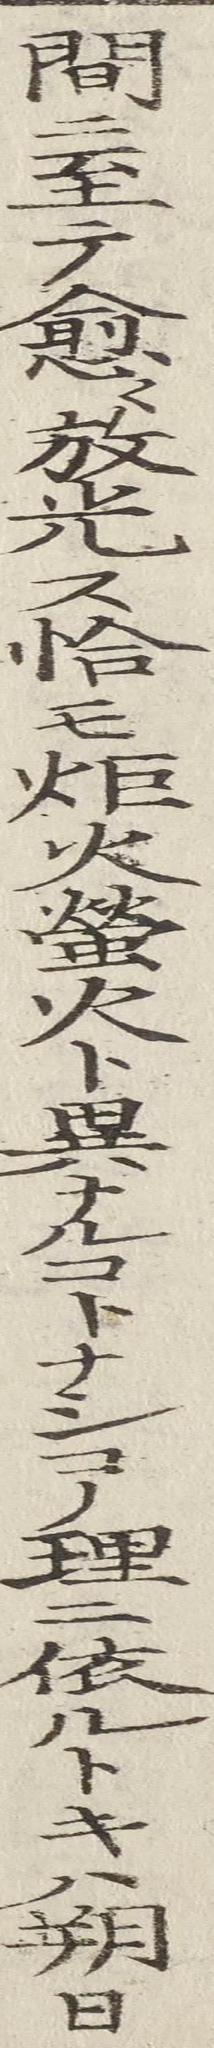間ニ至テ愈〱放光ス恰モ炬火蛍火ト異ナルコトナシコノ理ニ依ルトキハ朔日
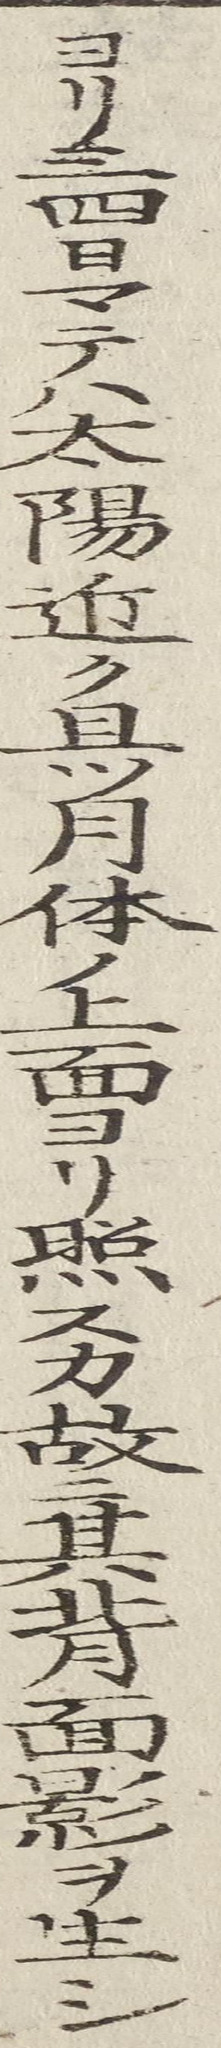ヨリ三四日マテハ太陽近ク且ツ月体ノ上面ヨリ照スカ故ニ其背面影ヲ生シ
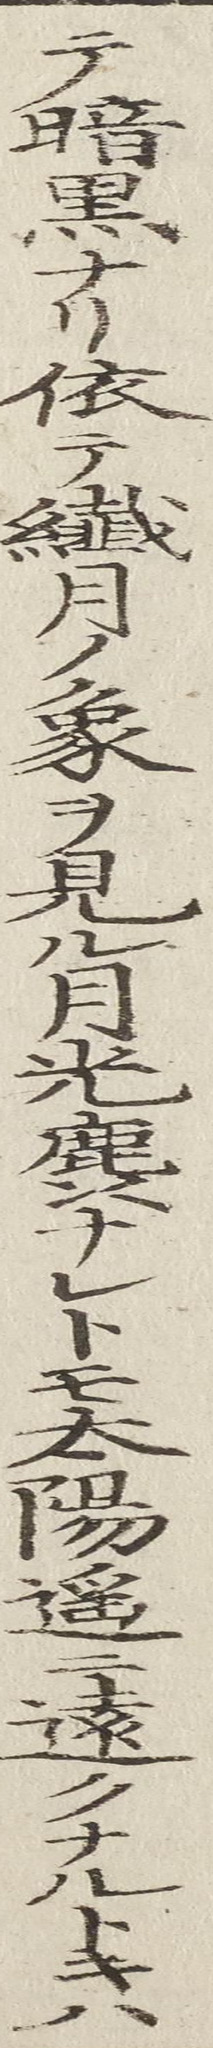テ暗黒ナリ依テ繊月ノ象ヲ見ル月光麤ナレトモ大洋遥ニ遠クナルトキハ
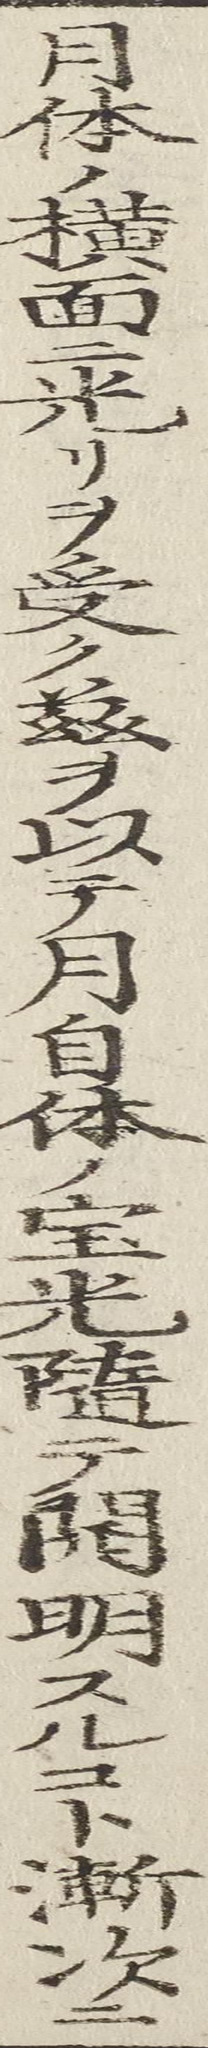月体ノ横面ニ光リヲ受ク茲ヲ以テ月自体ノ宝光随テ開明スルコト漸次ニ
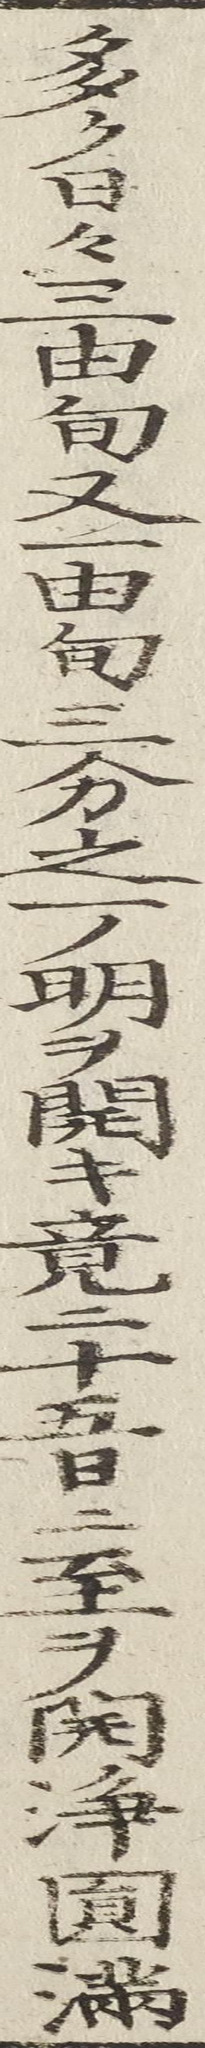多ク日々三由旬又一由旬三分之一ノ明ヲ開キ竟二十五日ニ至ヲ開浄円満
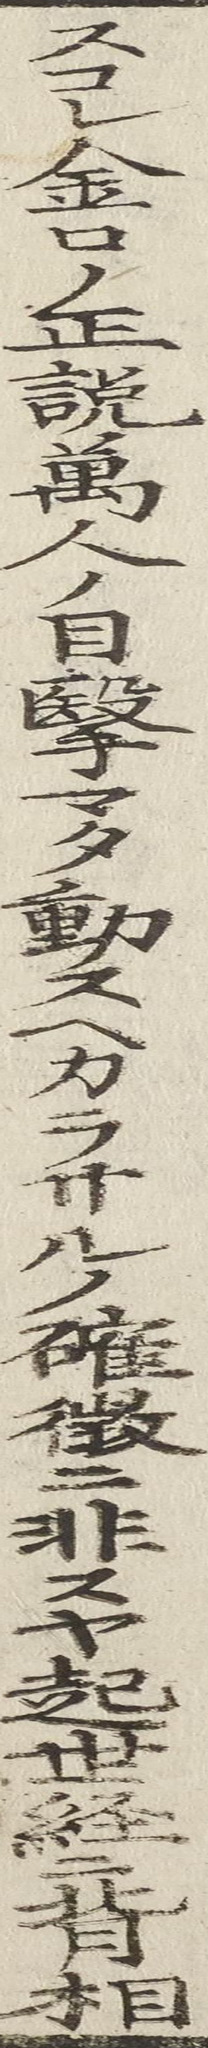スコレ金口ノ正説万人ノ目撃マタ動スヘカラサルノ確徴ニ非スヤ起世経ニ背相
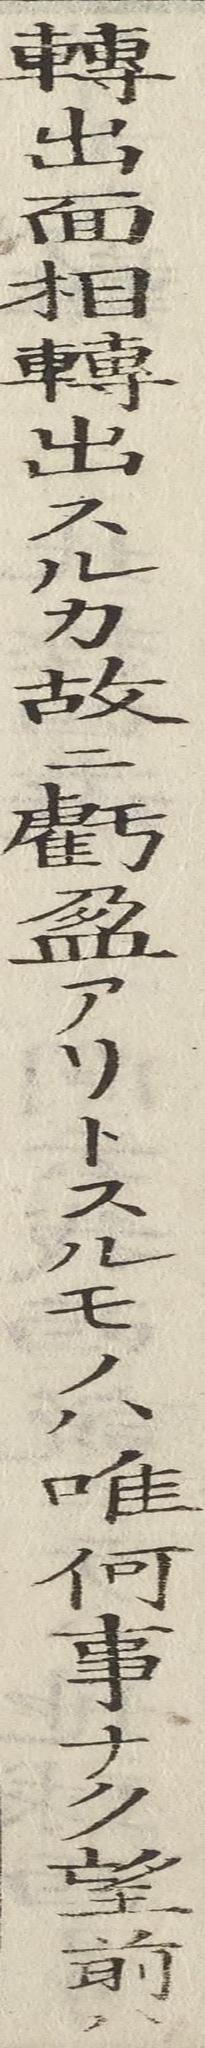転出面相転出スルカ故ニ虧盈アリトスルモノハ唯何事ナク望前ハ
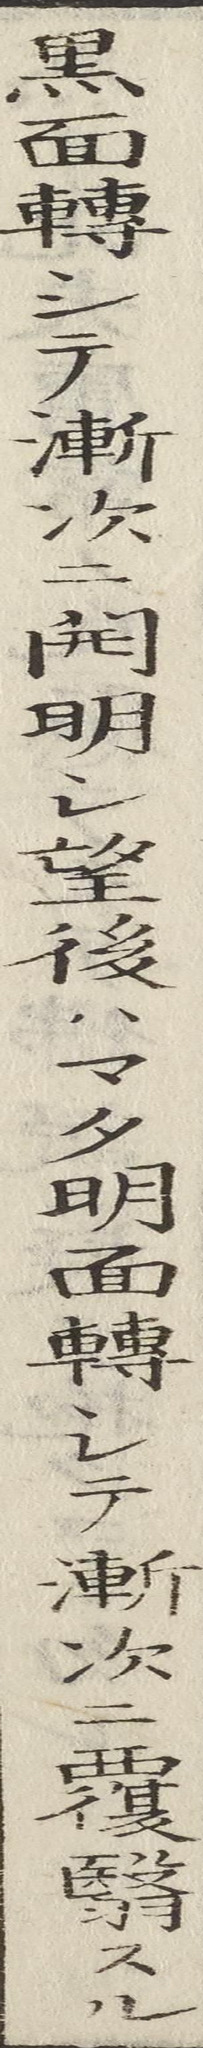黒面転シテ漸次ニ開明シ望後ハマタ明面転シテ漸次ニ覆翳スル
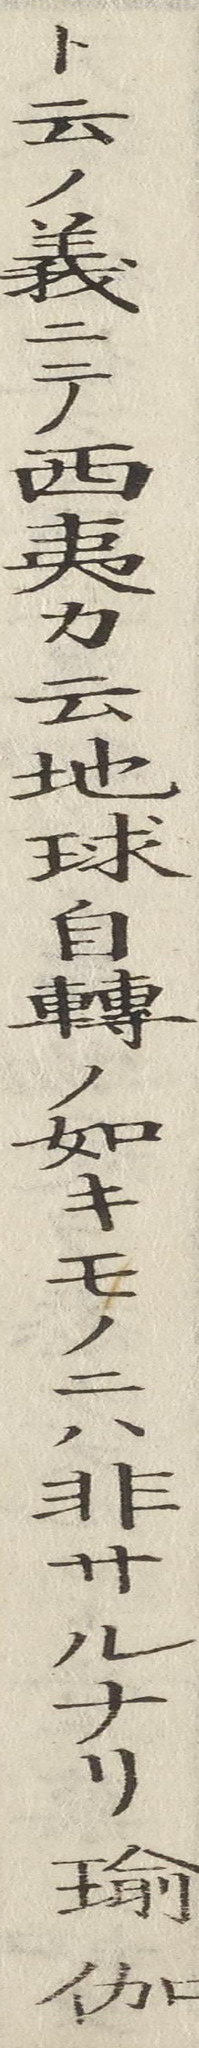ト云ノ義ニテ西夷カ云地球自転ノ如キモノニハ非サルナリ瑜伽
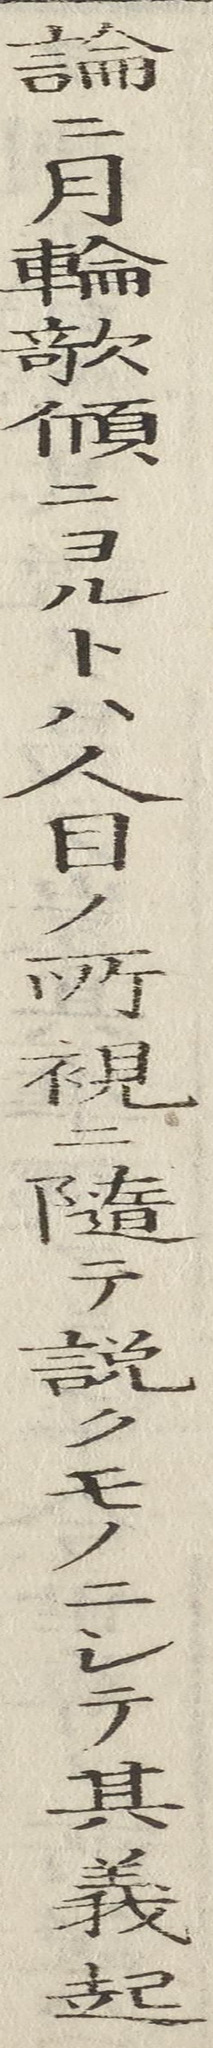論ニ月輪歌頎ニヨルトハ人目ノ所視ニ随テ説クモノニシテ其義起
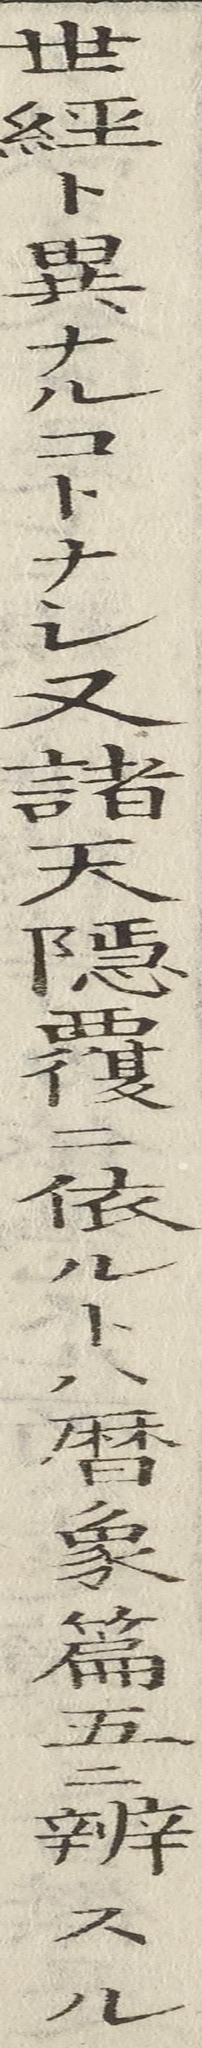世経ト異ナルコトナシ又諸天隠覆ニ依ルトハ暦象篇五ニ弁スル
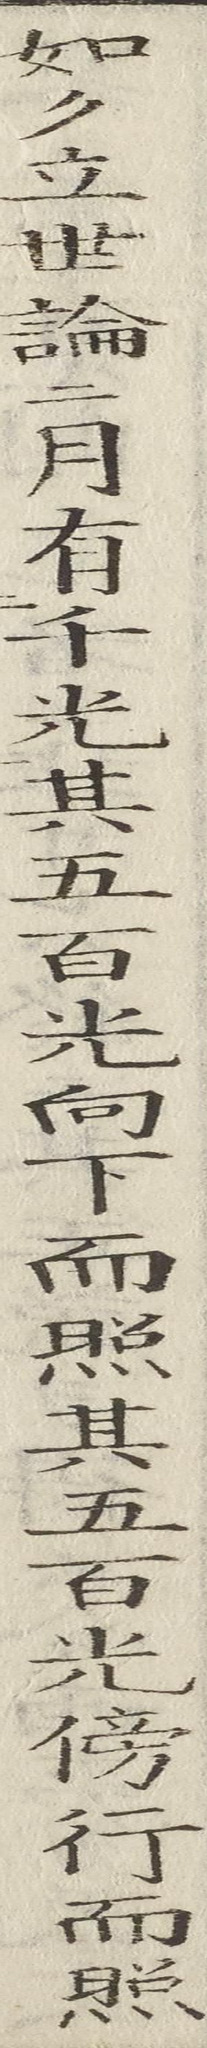如ク立世論ニ月有ニ千光其五百光向下而照其五百光傍行而照
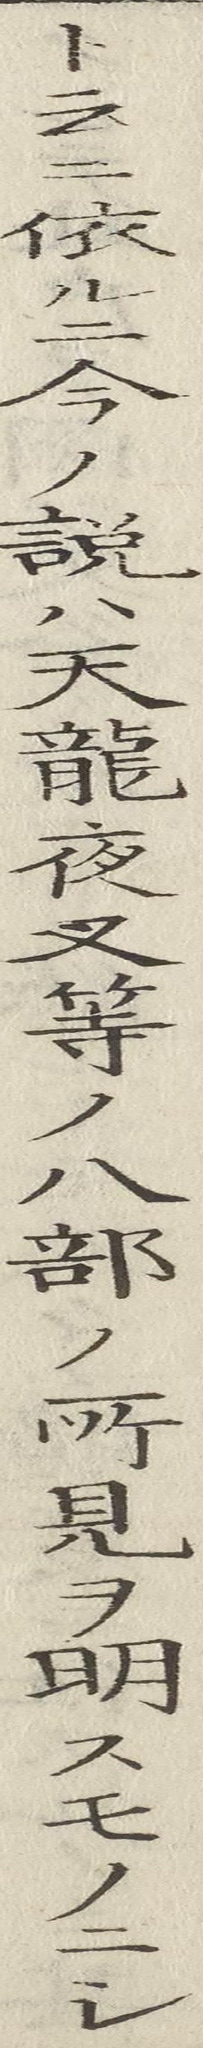ト云ニ依ルニ今ノ説ハ天龍夜叉等ノ八部ノ所見ヲ明スモノニシ
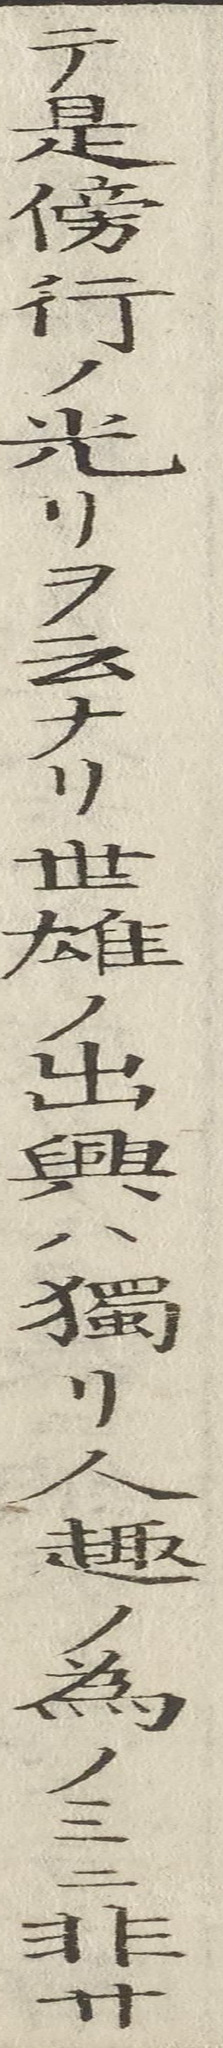テ是傍行ノ光リヲ云ナリ世雄ノ出興ハ独リ人趣ノ為ノミニ非サ
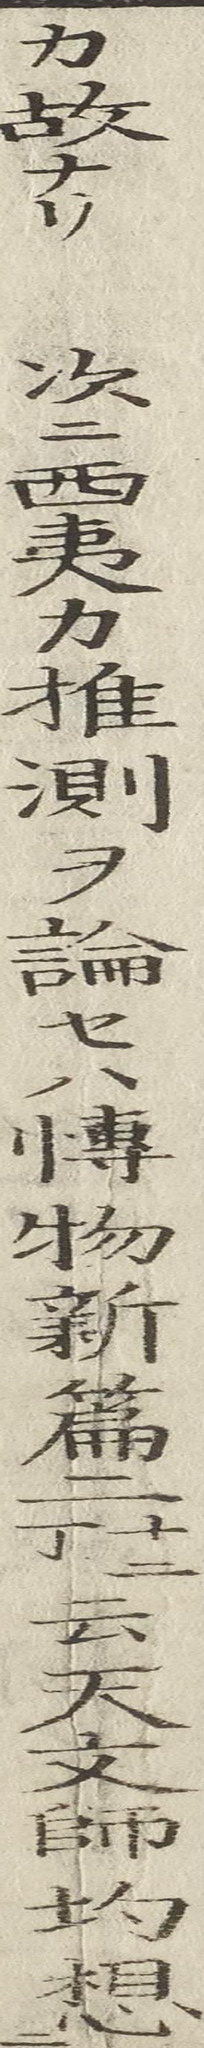カ故ナリ次ニ西夷カ推測ヲ論セハ慱物新篇ニ十二丁云天文師均想ニ
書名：護法新論　二編　中
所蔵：東京大学地震研究所図書室 Earthquake Research Institute Library, The University of Tokyo, JAPAN
